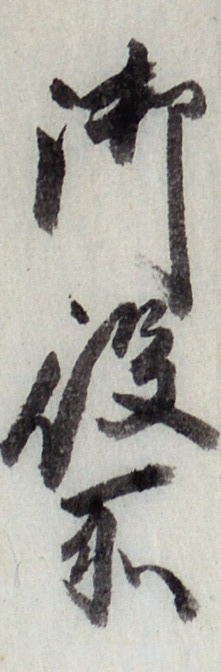御役所
